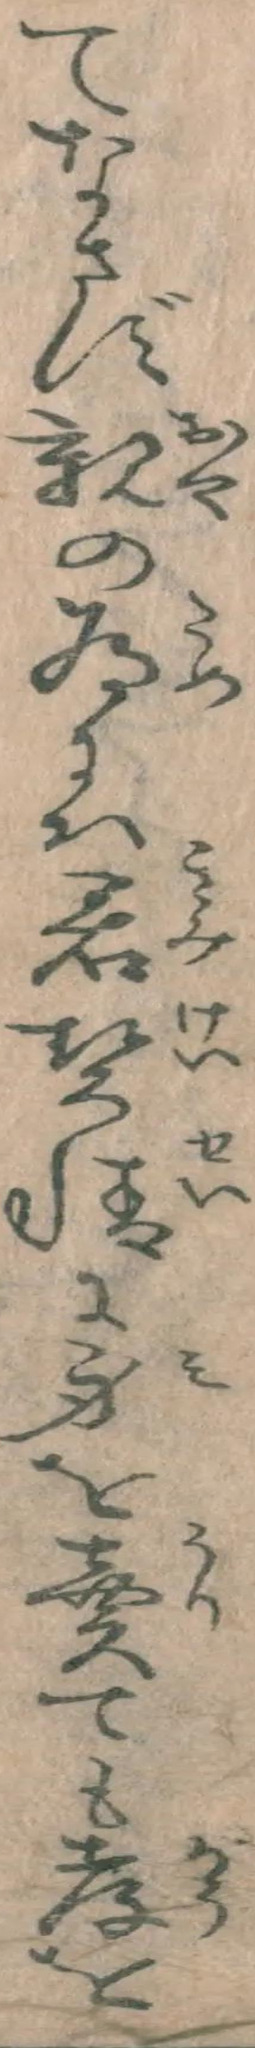てなさず親の為には君契情に身を売ても孝を
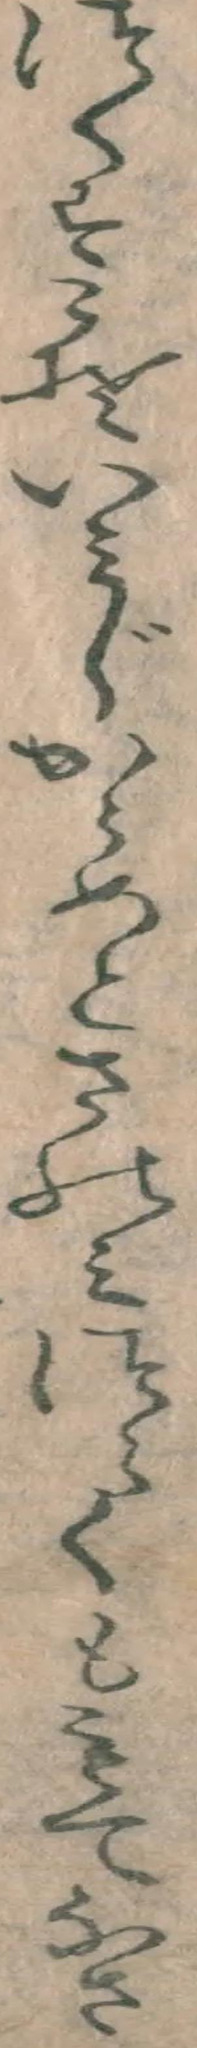つくすこそいみぢからめとさのみつらくももてなさ
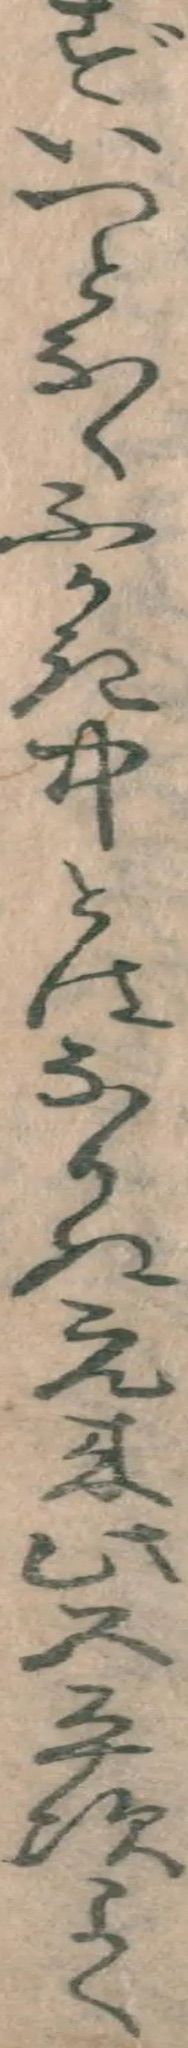ずいつとなくふかき中とはなりぬ元来此五平次よく
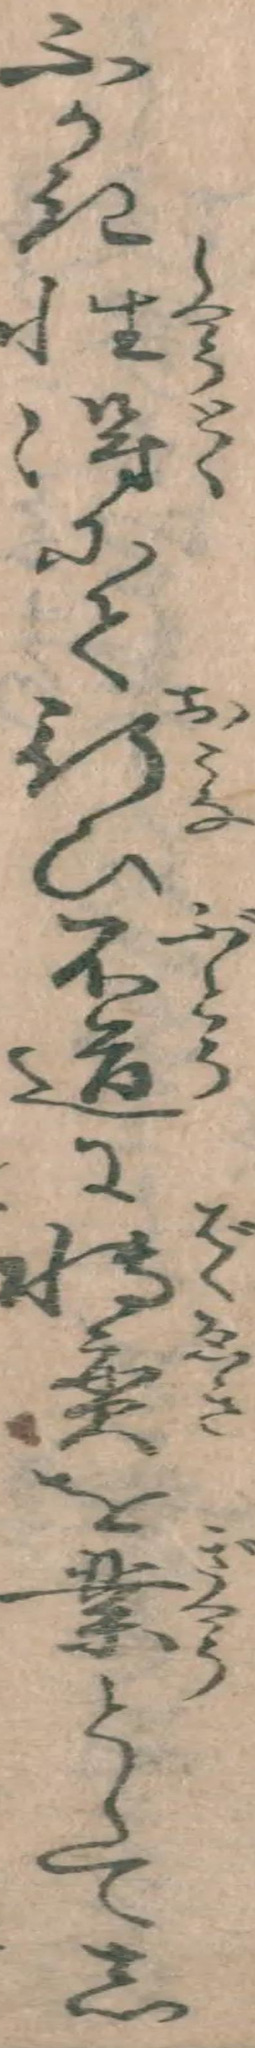ふかき性得にて行ひ不道に博奕を業としてし
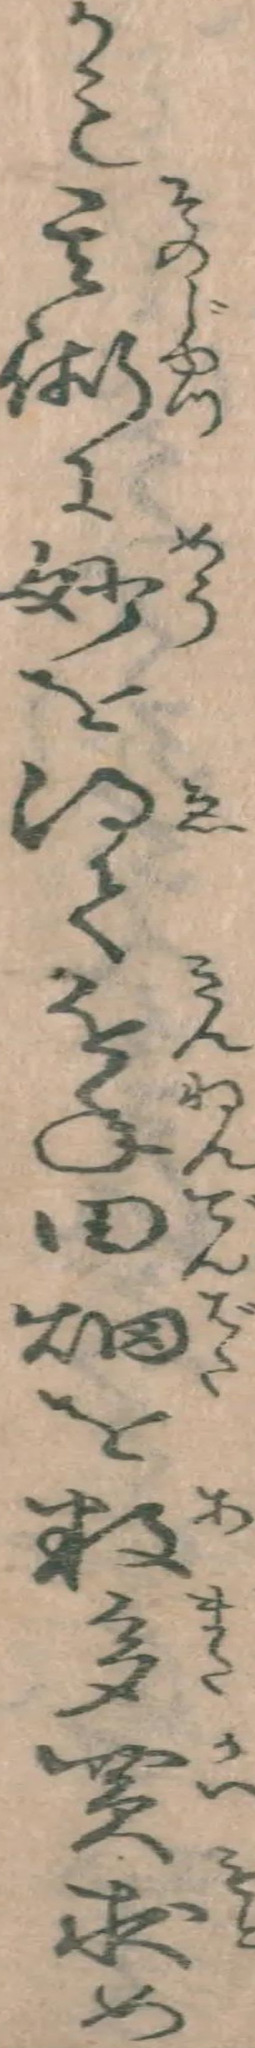かも其術に妙を得て近年田畑を数多買求め
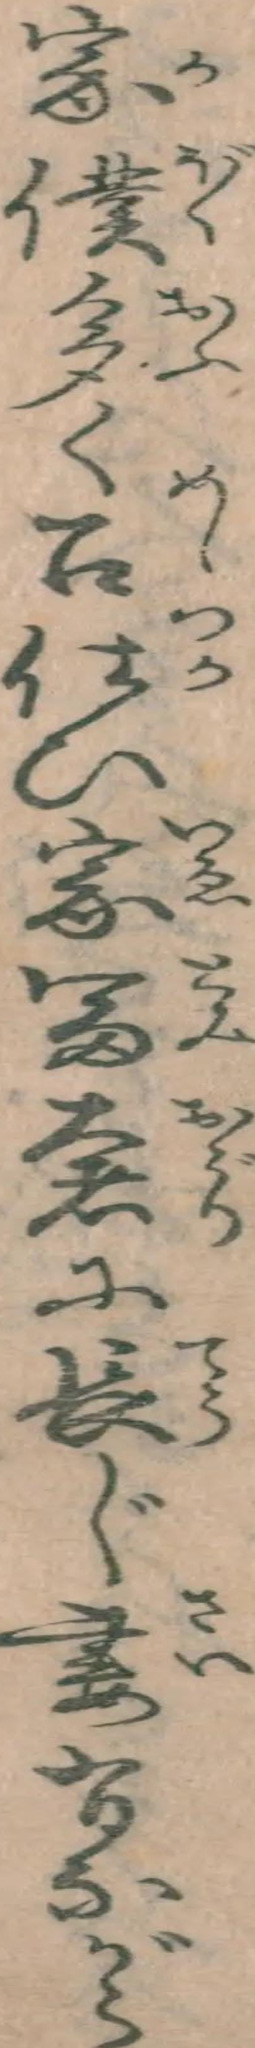家僕多く召使ひ家富奢に長じ妻有ながら
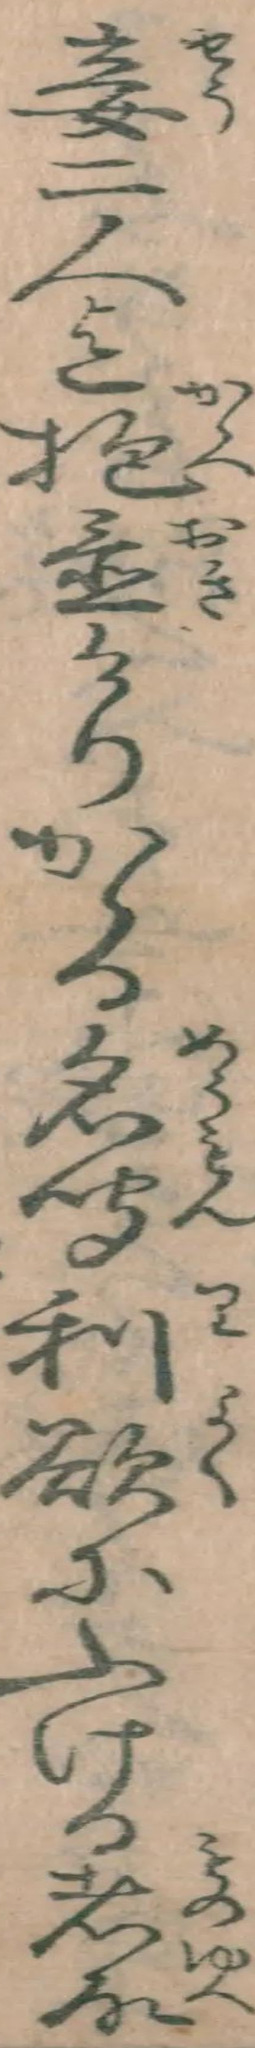妾二人迄抱置けりかゝる名聞利欲にふける者故
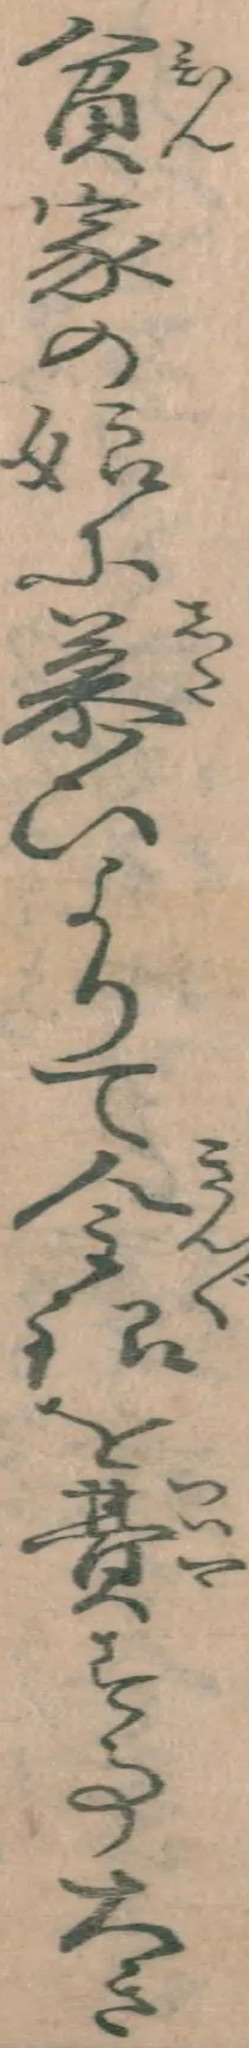貧家の娘に慕ひよりて金銀を費す事大き
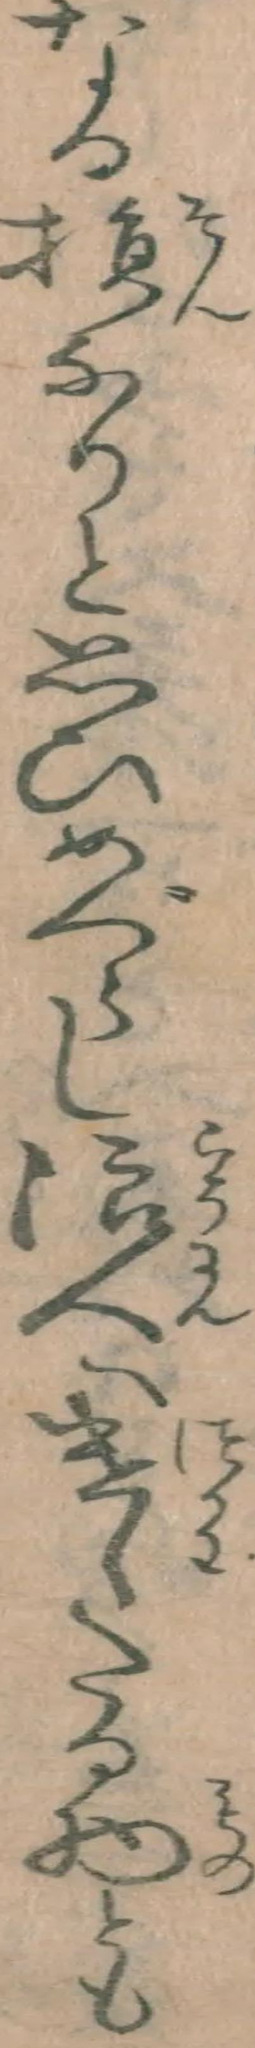なる損なりと思ひめぐらし浪人へ遣したる物とも
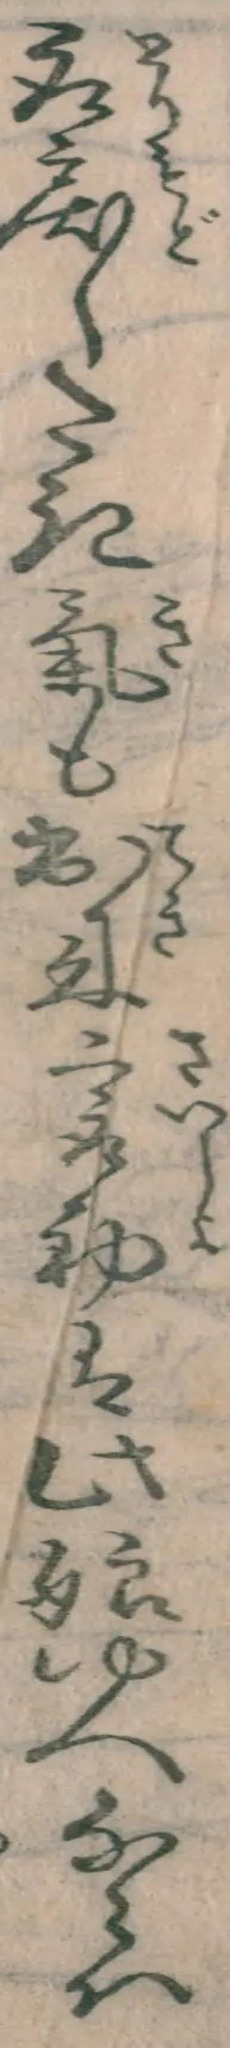取戻したき気も出来最初は此娘ゆへならは
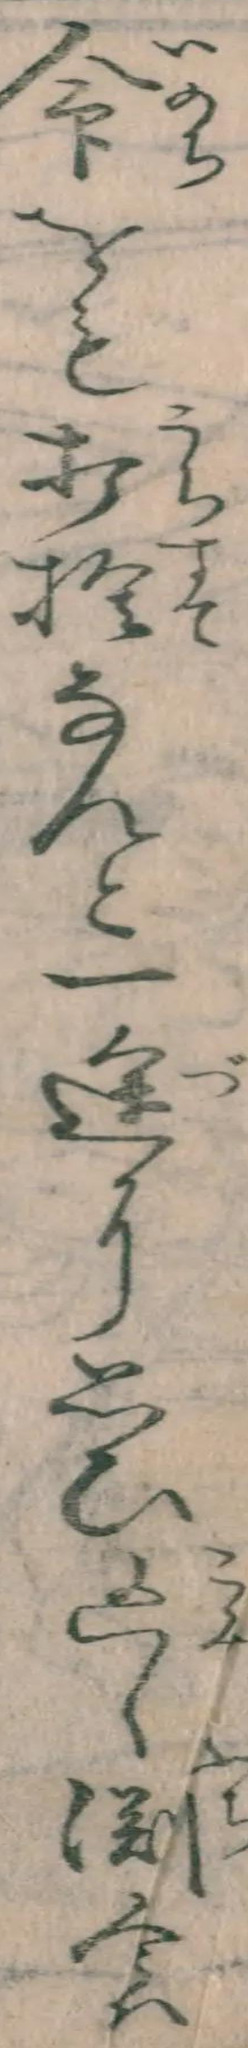命をも打捨なんと一途に思ひ込し渕今は
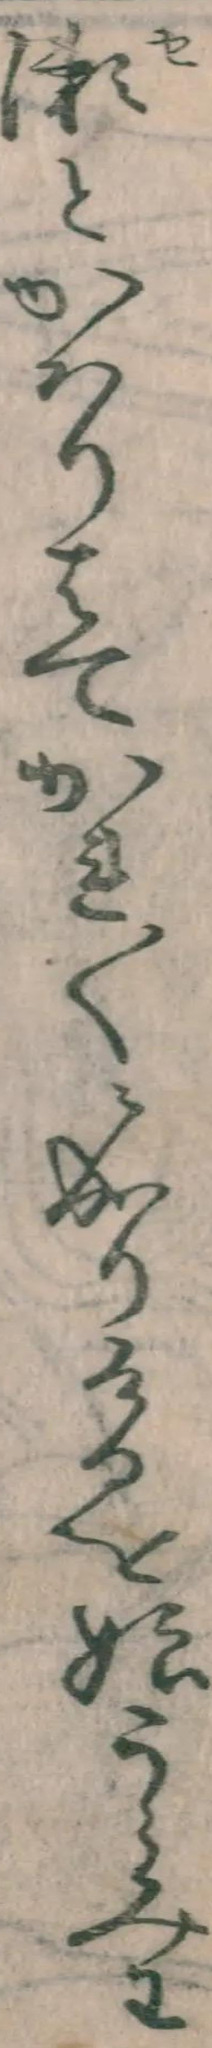瀬とかはりはてかれ〳〵に成りけるを娘うらみわ
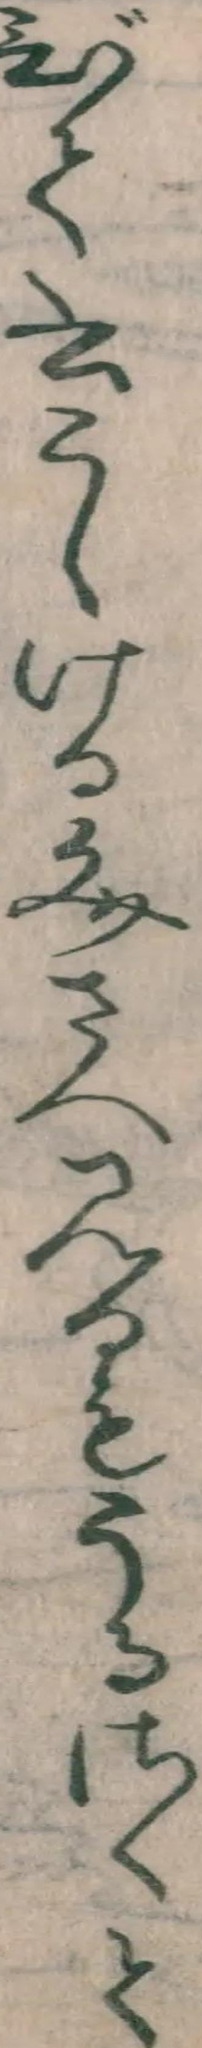びて書こしける文さへ見るもうるさくて
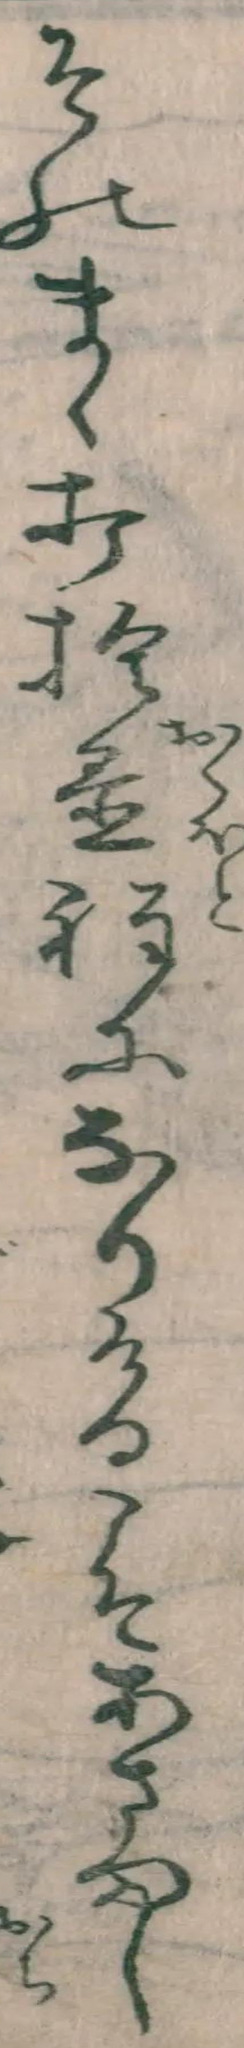そのまゝ打捨置程になりけるこそあさまし
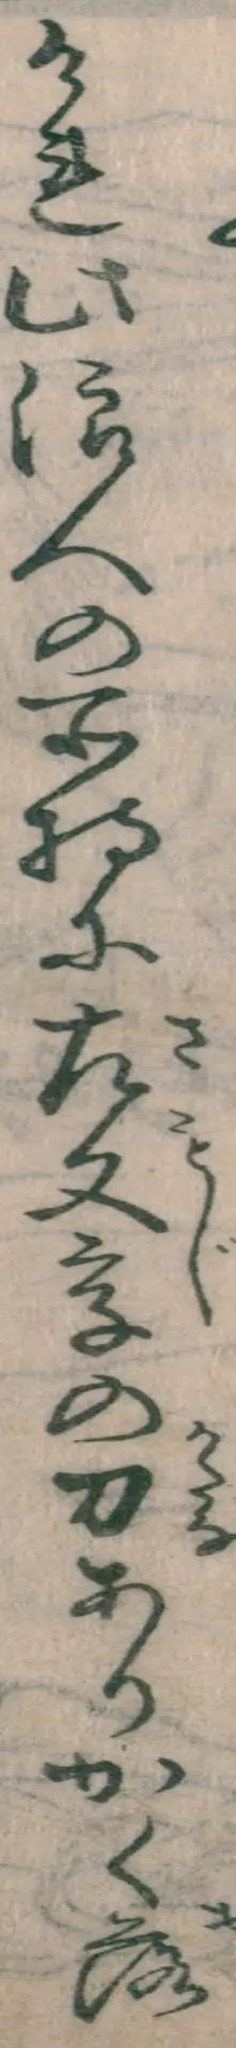けれ此浪人の所持に左文字の刀ありかく落
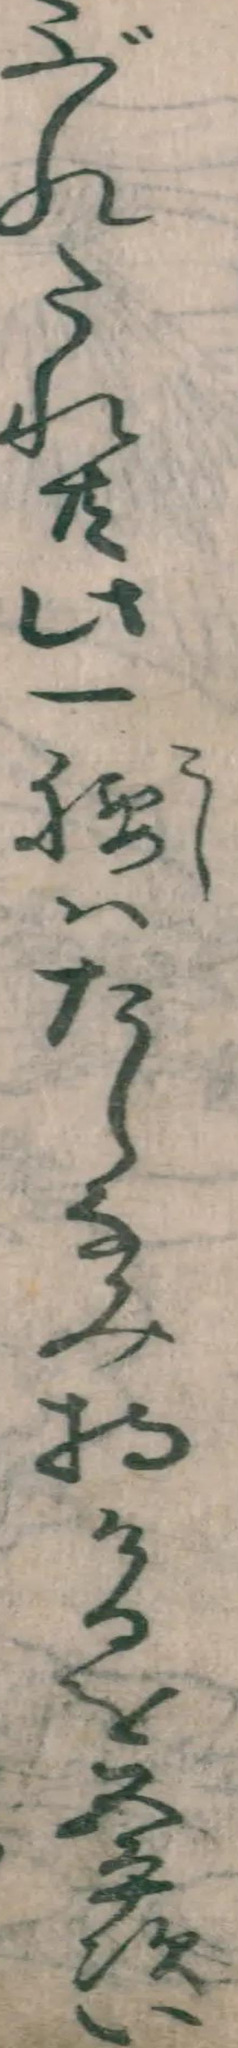ぶれたれ共此一腰はたしなみ持けるを五平次い
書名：怪談御伽童 5巻. [2]
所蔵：国立国会図書館 National Diet Library, JAPAN
